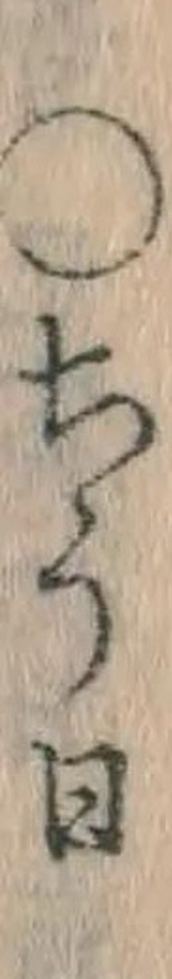○ちう日
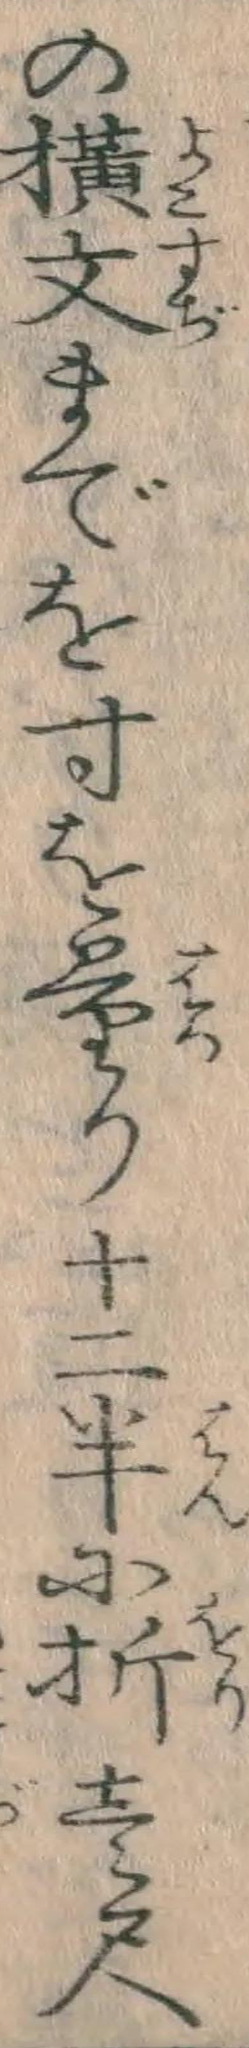の横文までを寸を量り十二半に折壱尺
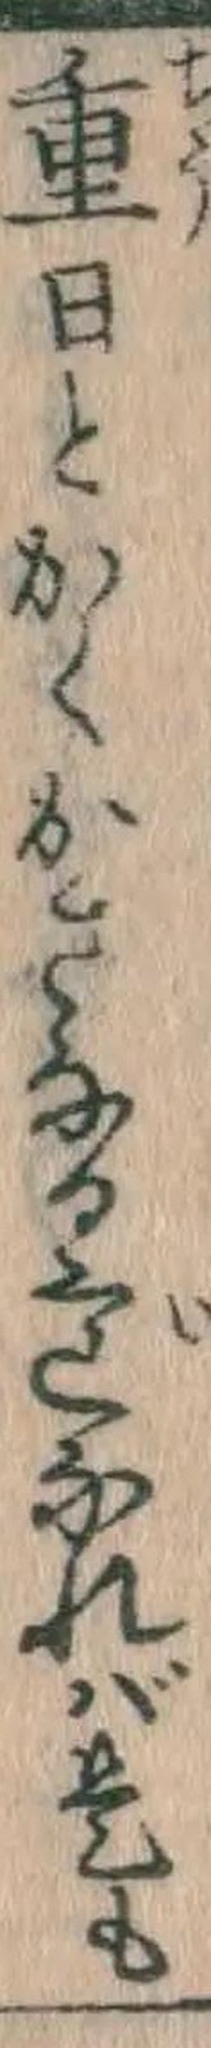重日とかくかさなる意なれば是も
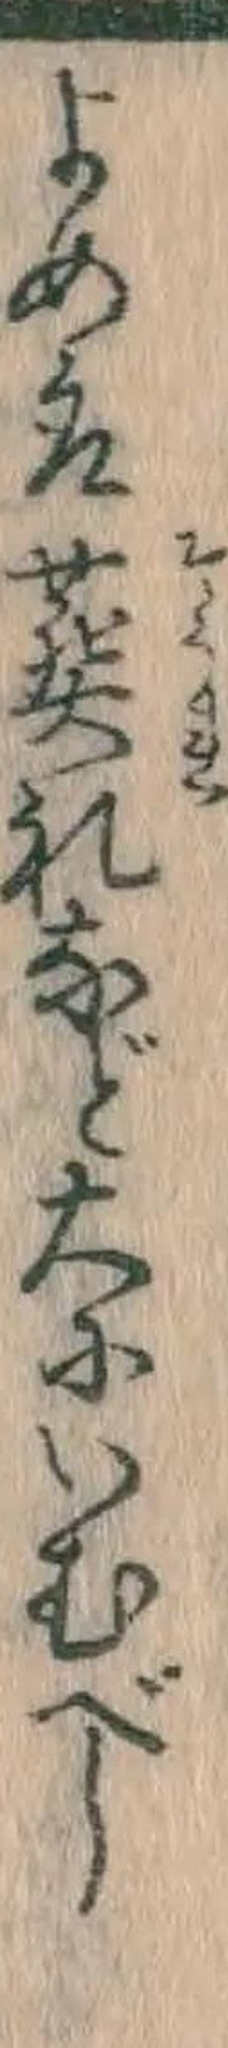よめ取葬礼など大にいむべし
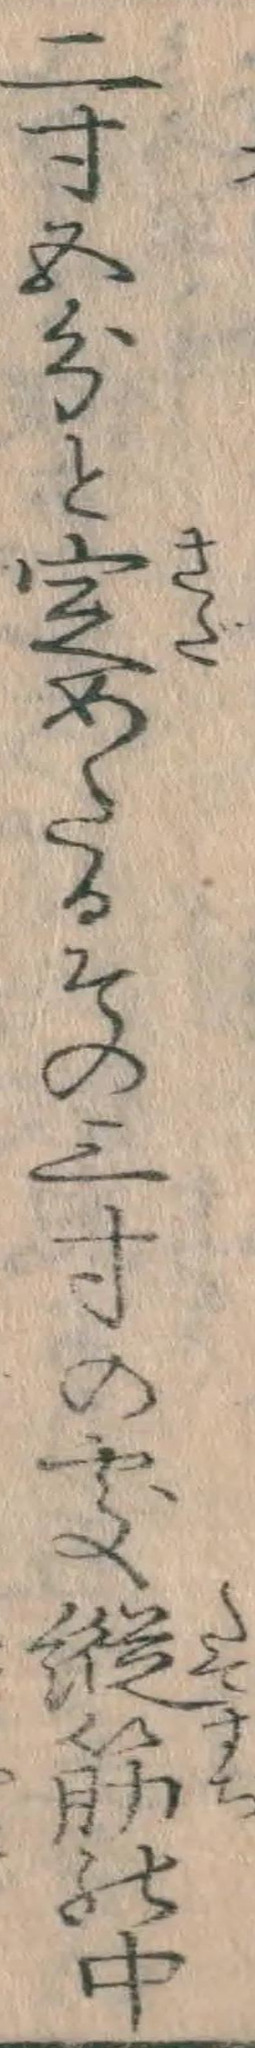二寸五分と定めたるその三寸の処縦筋の中
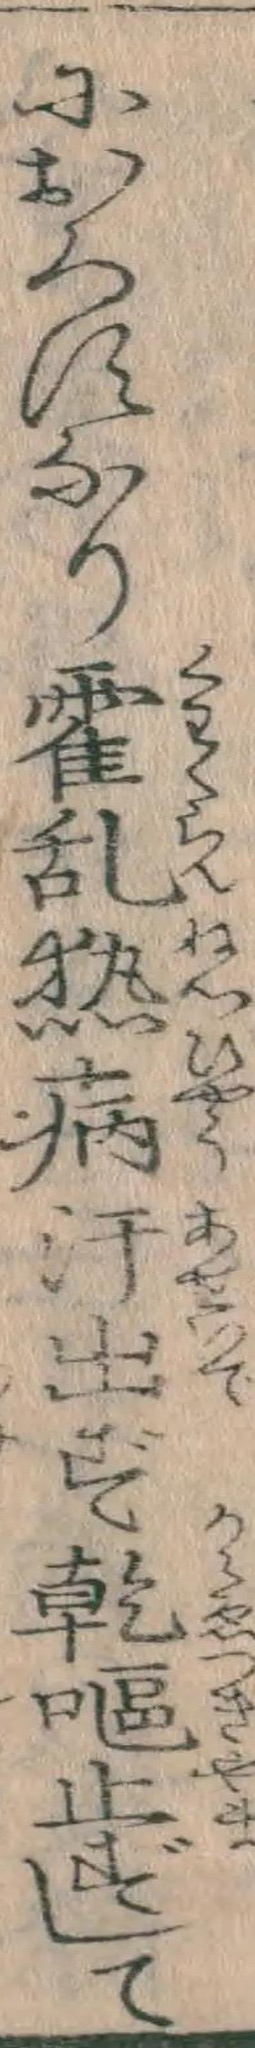におろすなり霍乱熱病汗出ず乾嘔止ずして
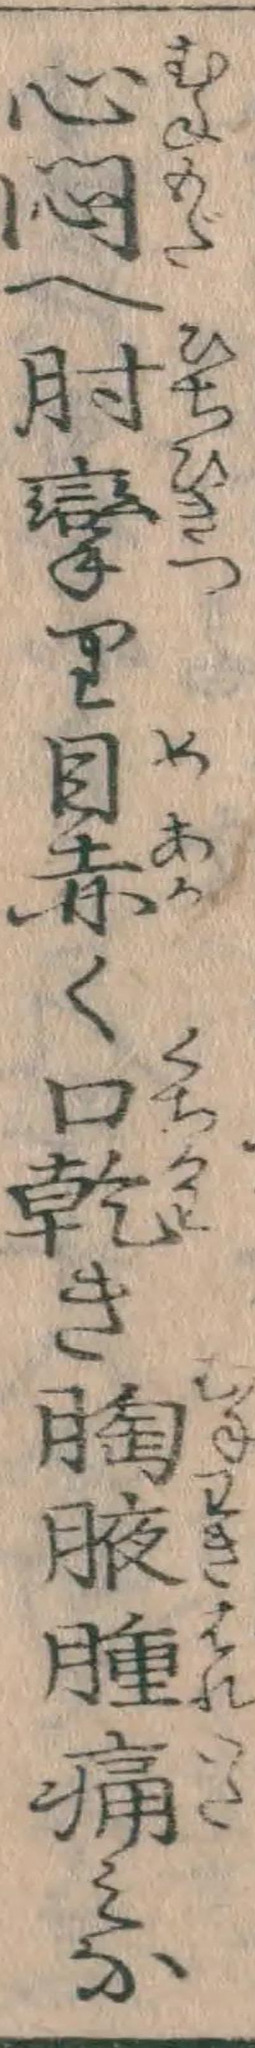心悶へ肘攣り目赤く口乾き胸腋腫痛みな
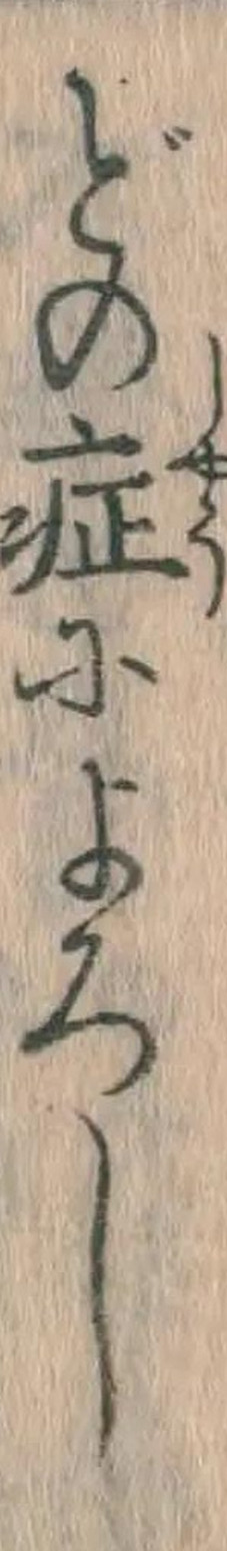どの症によろし
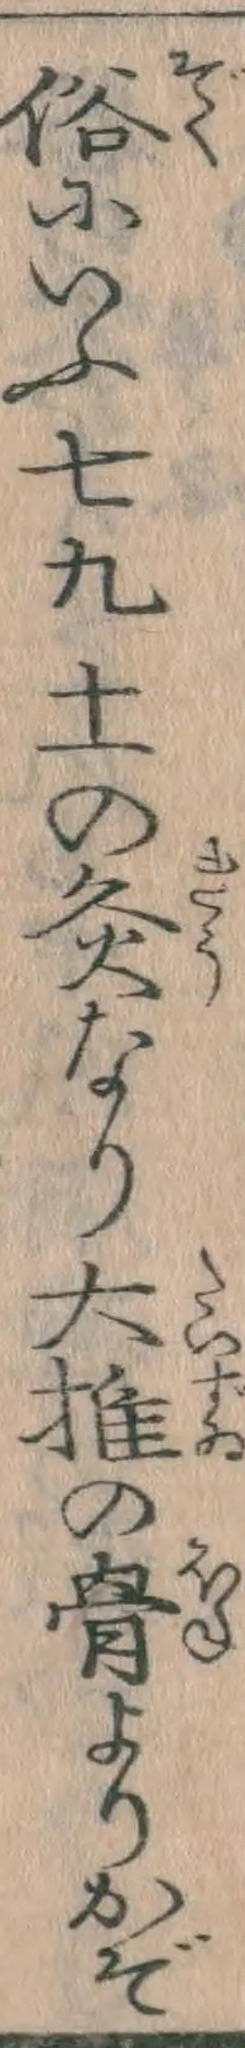俗にいふ七九十一の灸なり大椎の骨よりかぞ
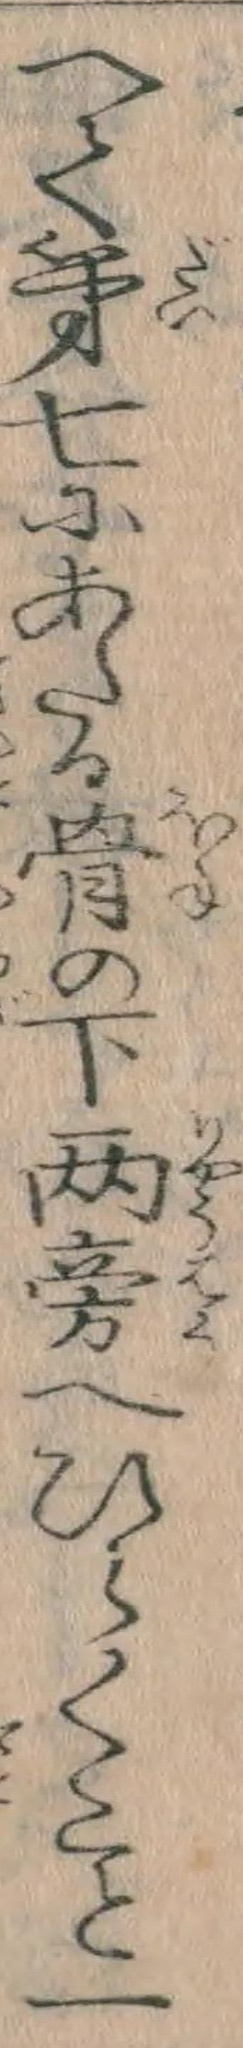へて第七にあたる骨の下両旁へひらくこと一
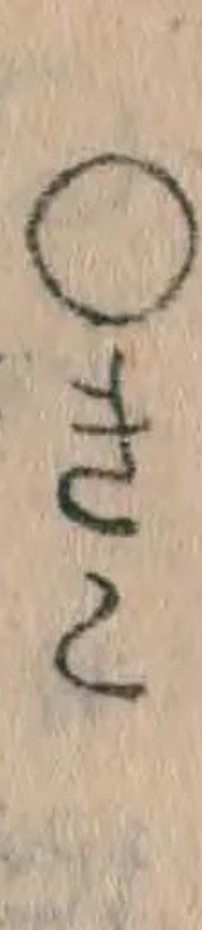○きこ
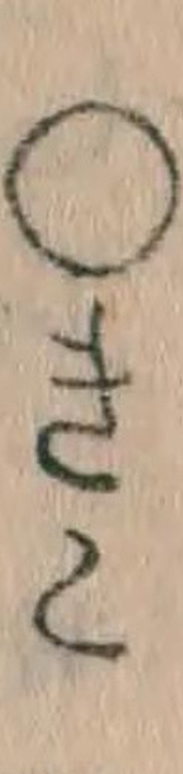○きこ
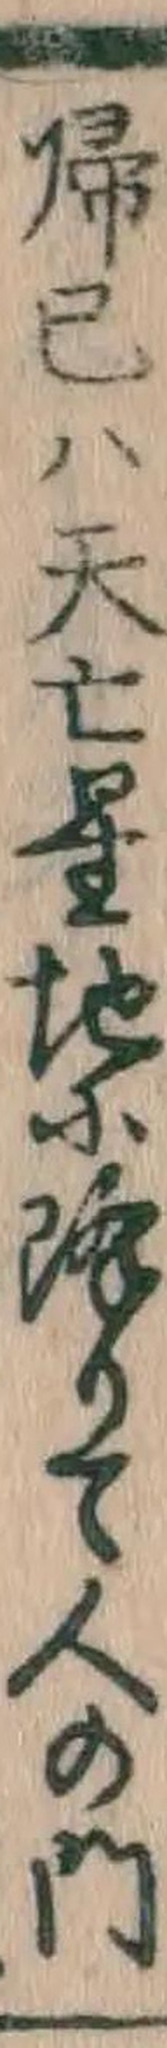帰己は天亡星地に降りて人の門
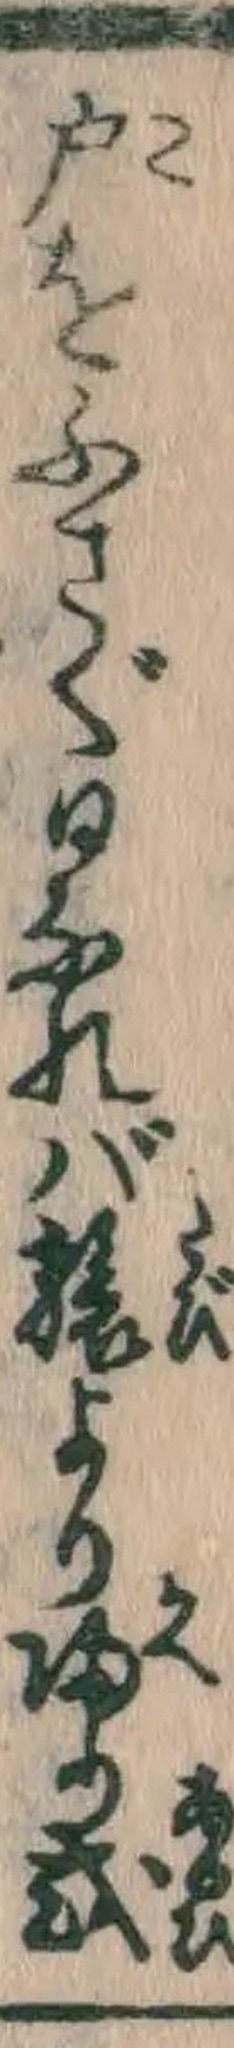戸をふさぐ日なれば旅より帰り或
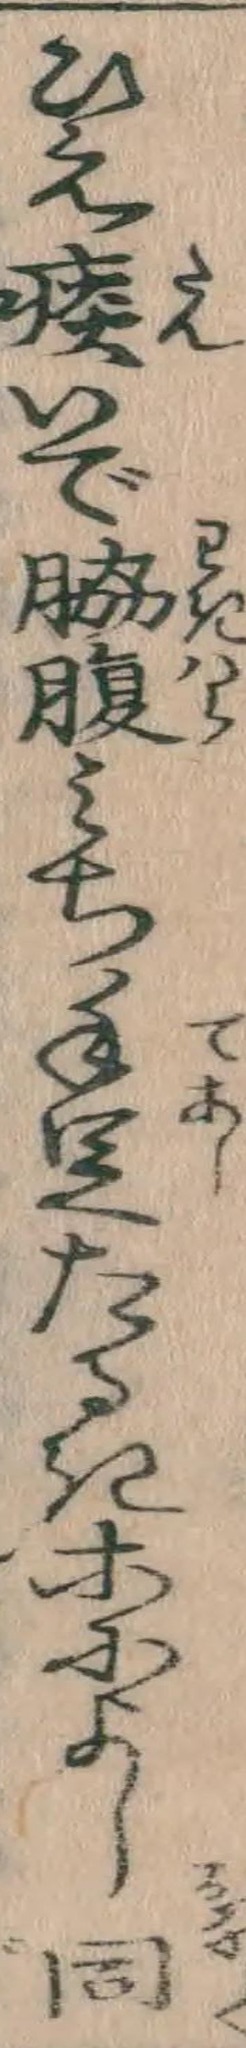ひえ痰いで脇腹みち手足たるき等によし同
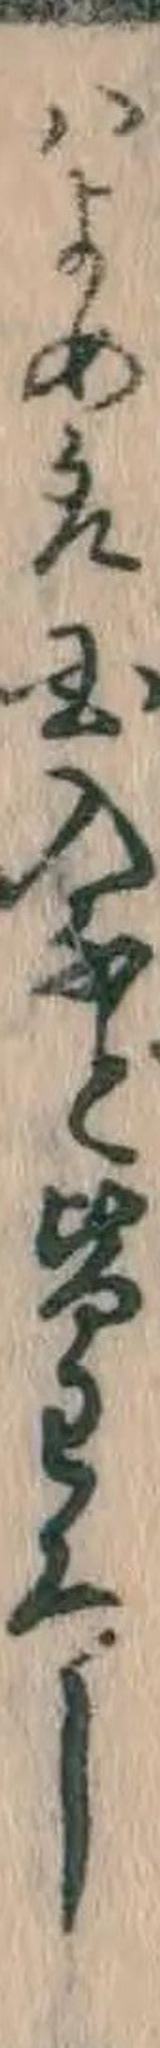はよめ取国入など皆わろし
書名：広益秘事大全 3巻. [4]
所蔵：国立国会図書館 National Diet Library, JAPAN
